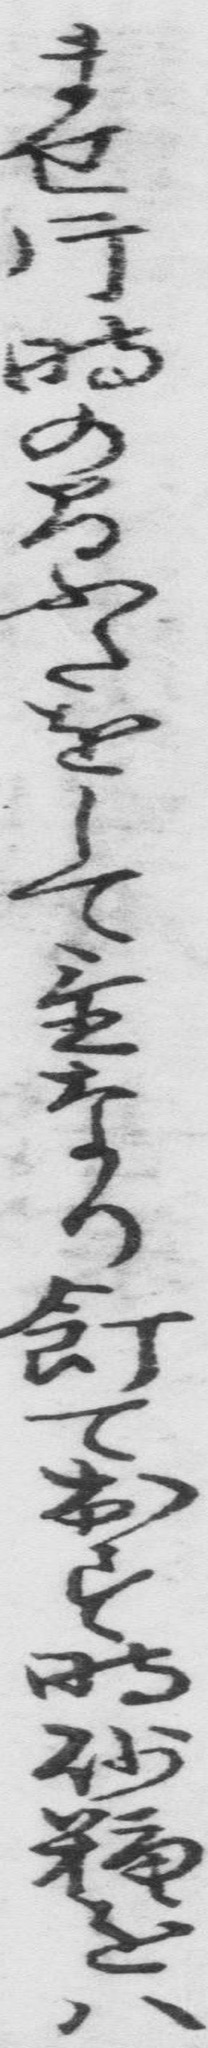ませ片時の間ふたをして置なり飣て出春時砂糖をは
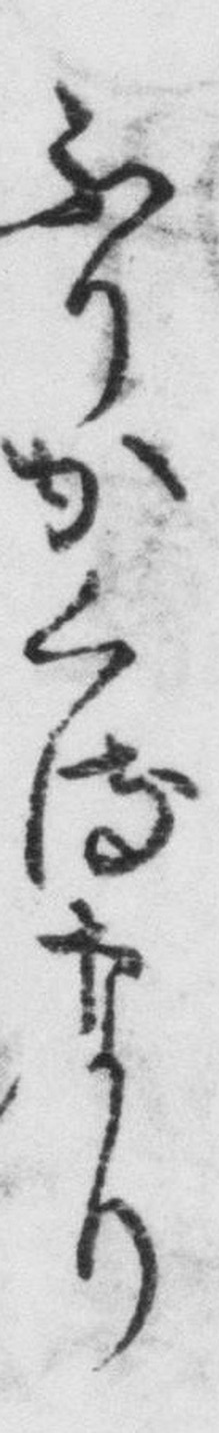ふりかく流なり
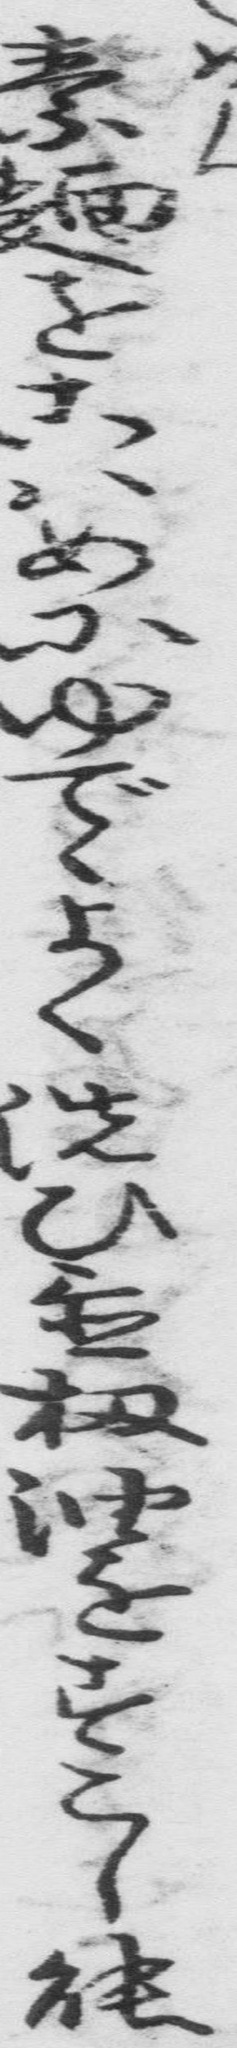素麺を古はめ尓ゆでゝよく洗ひ置扨油を春こし能
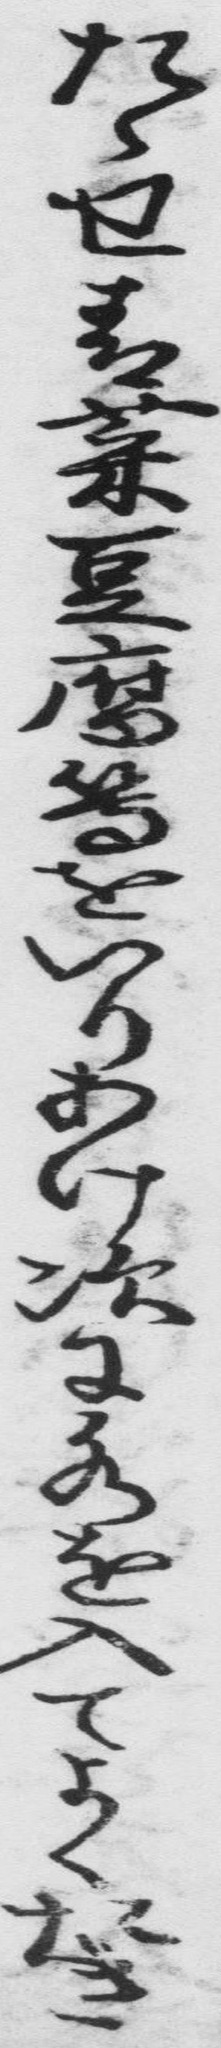たゝせ青菜豆腐等をいりあけ次尓水を入てよくたき
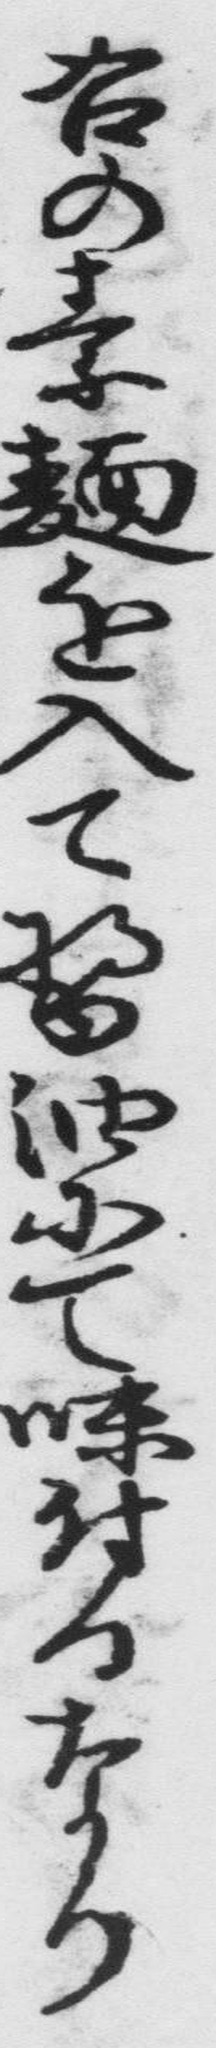右の素麺を入て醤油尓て味付るなり
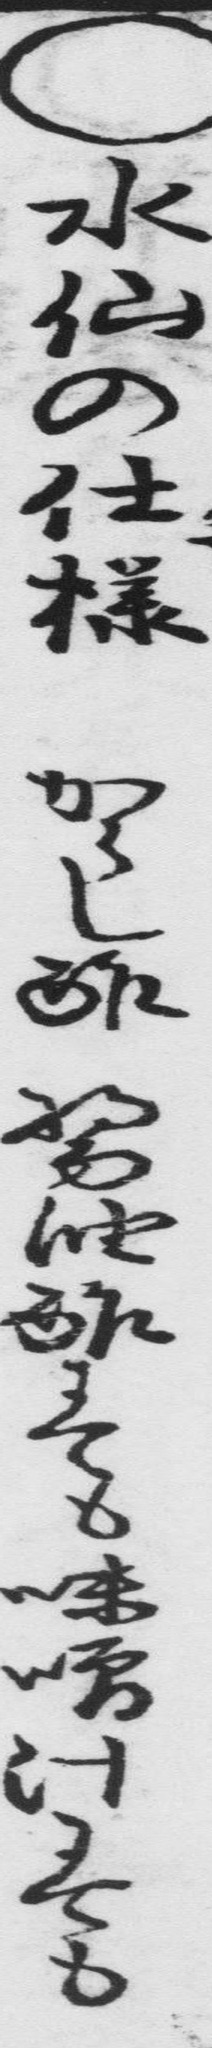〇水仙の仕様からし酢醤油酢尓ても味噌汁尓ても
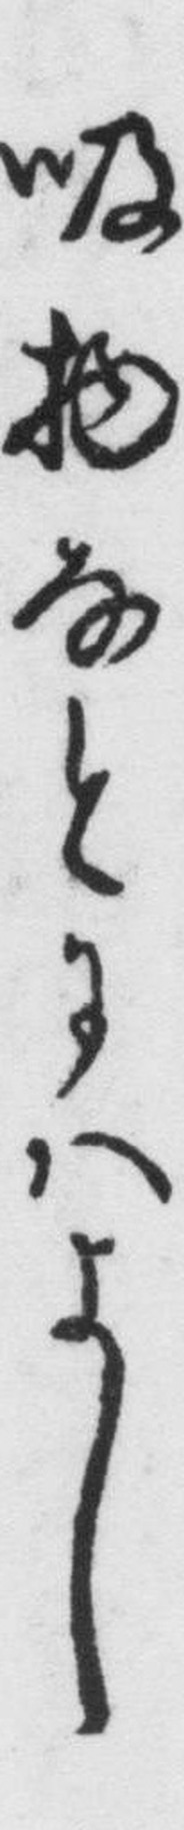吸物なと尓はよし
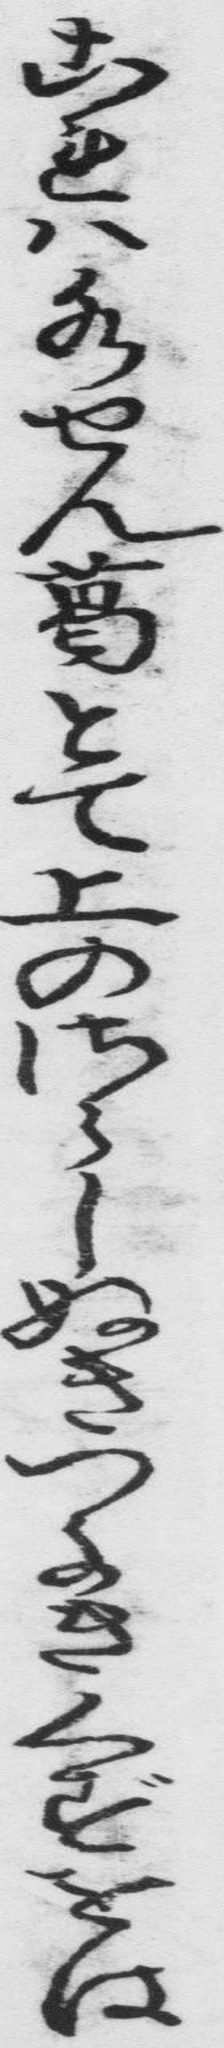古連は水せん葛とて上の佐らしぬきつふきくずをは
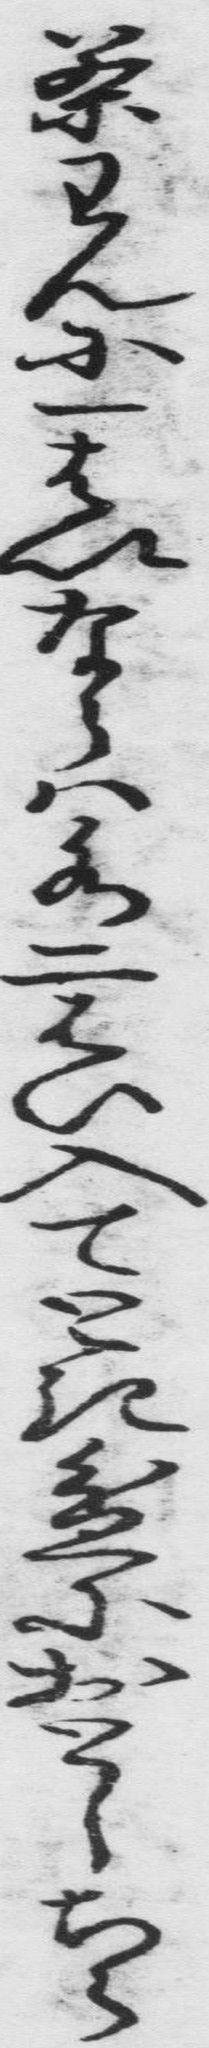茶わん尓一は以ならは水二はい入てと起盆尓おとしちら
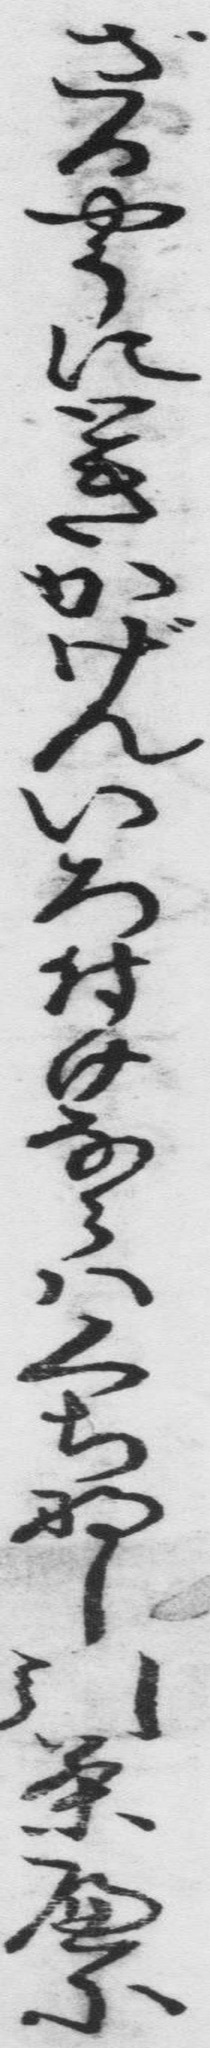ざるやうにときかげんいろ付ならはくち那し引茶扁尓
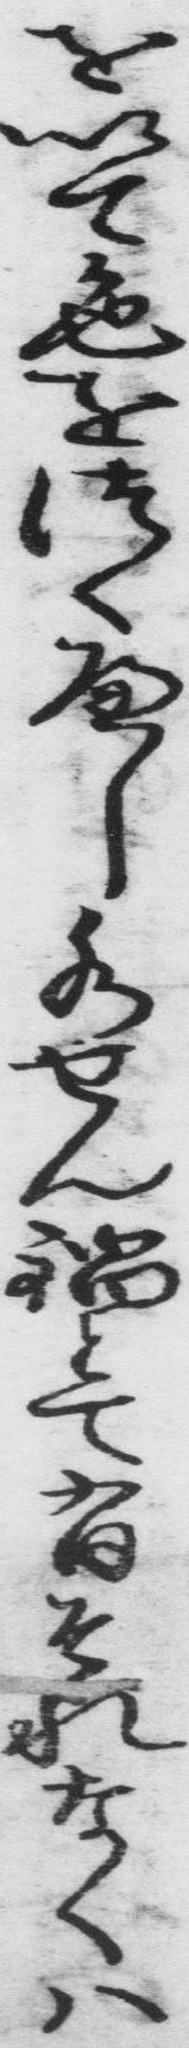を以て色を徒く扁し水せん鍋とて有それなくは
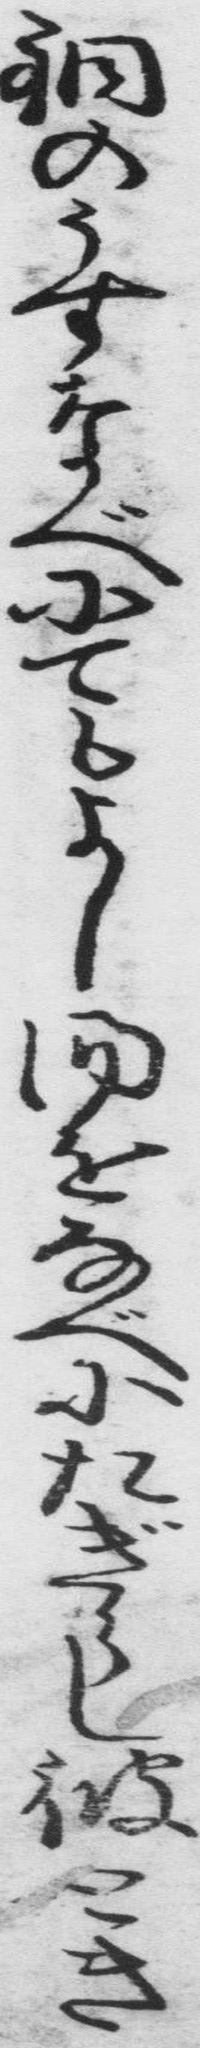銅のうすなべ尓てもよし湯をなべ尓たぎらし彼とき
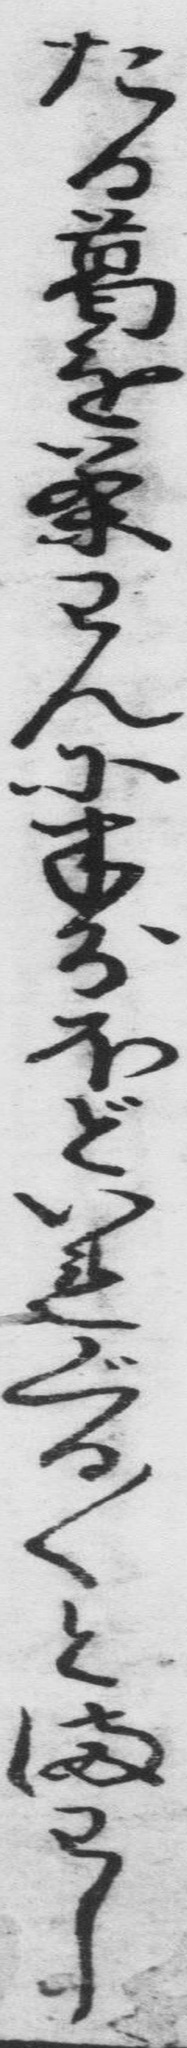たる葛を茶わん尓半分不どい連ぐる〳〵と満わし

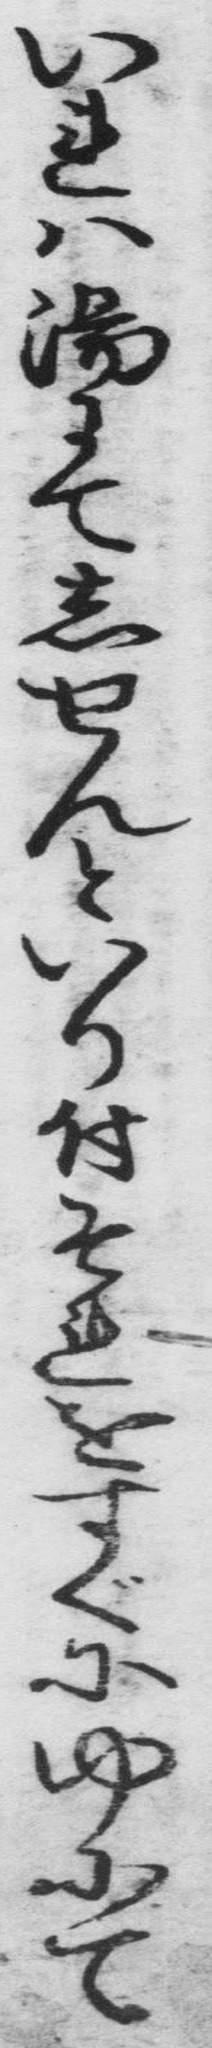い連は湯尓て志せんといり付そ連をすぐ尓ゆ尓て
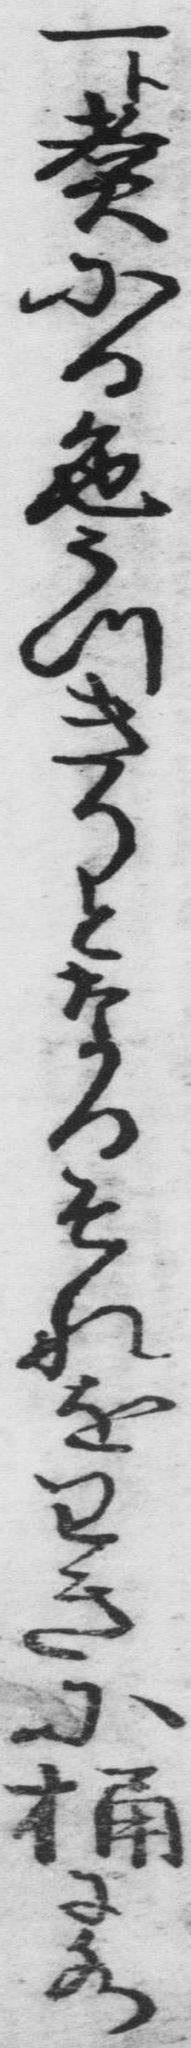一ㇳ煮尓る色か川きりとなるそれをわき尓桶尓水
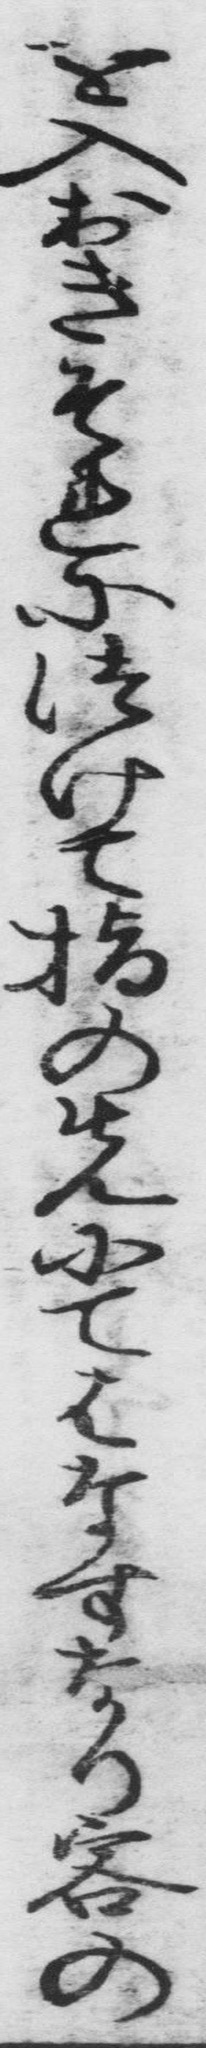を入おきそ連尓徒けて指の先尓てはなすなり客の
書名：普茶料理抄
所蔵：大阪府立大学学術情報センター 国文学研究資料館
